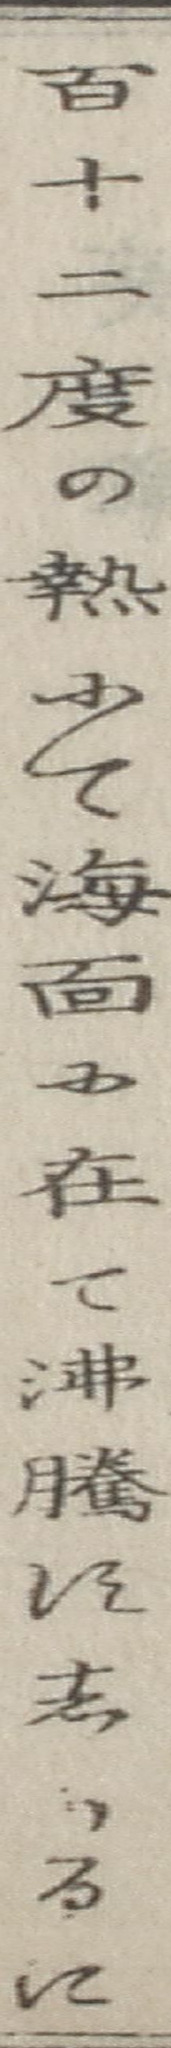百十二度の熱にて海面に在て沸騰すしかるに
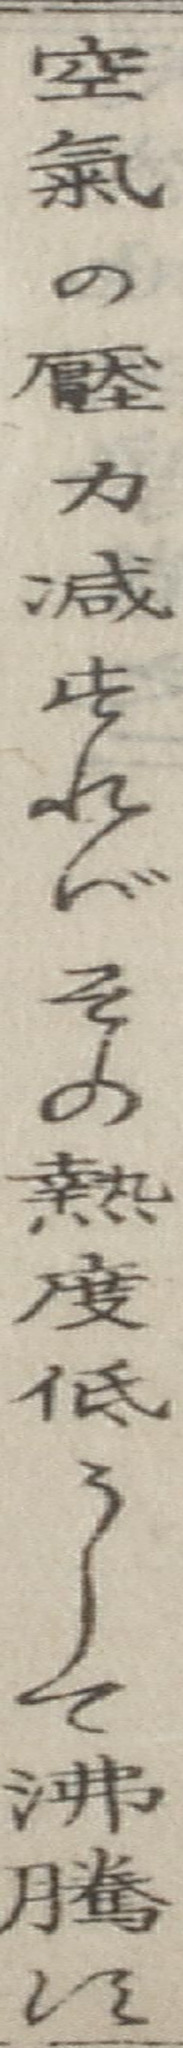空気の圧力減すればその熱度低うして沸騰す
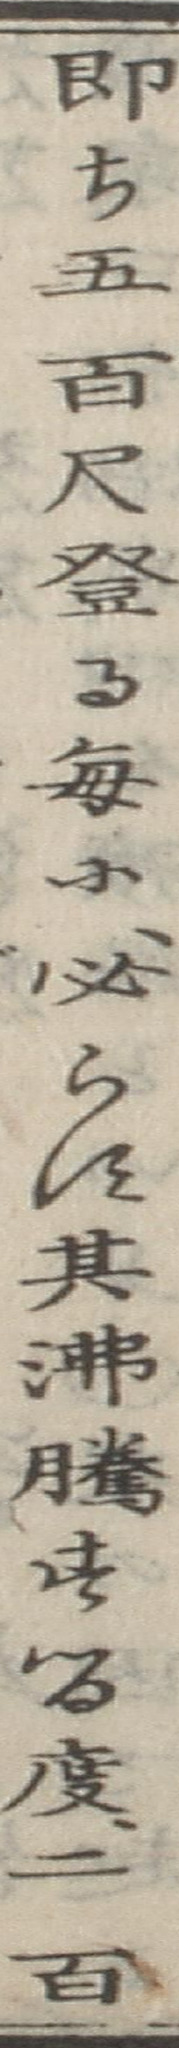即ち五百尺登る毎に、必らす其沸騰する度、二百
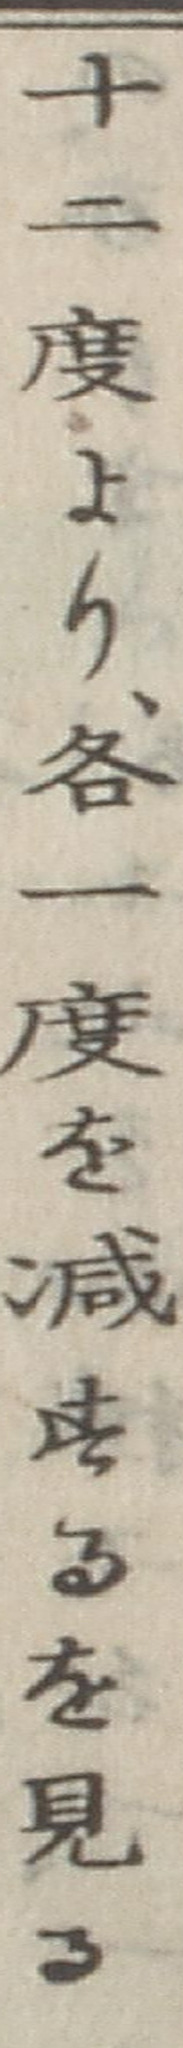十二度より、各一度を減するを見る
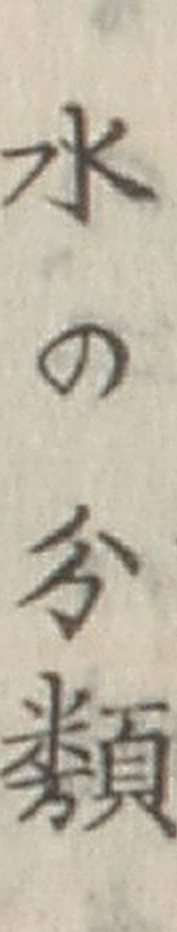水の分類
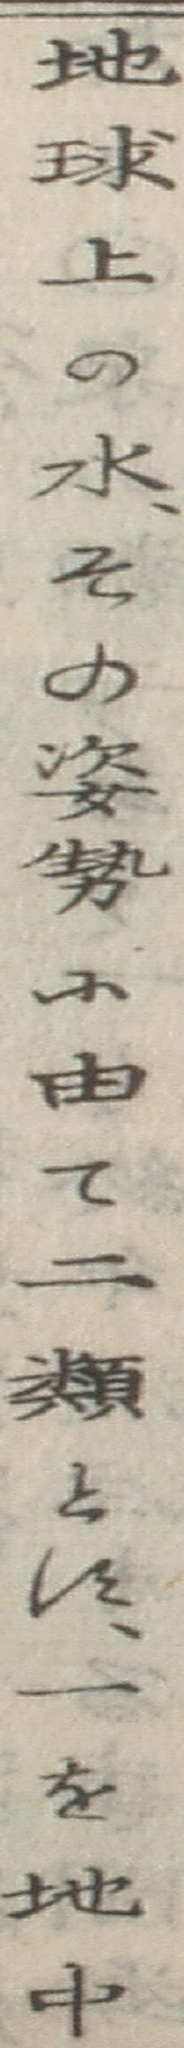地球上の水、その姿勢に由て二類とす、一を地中
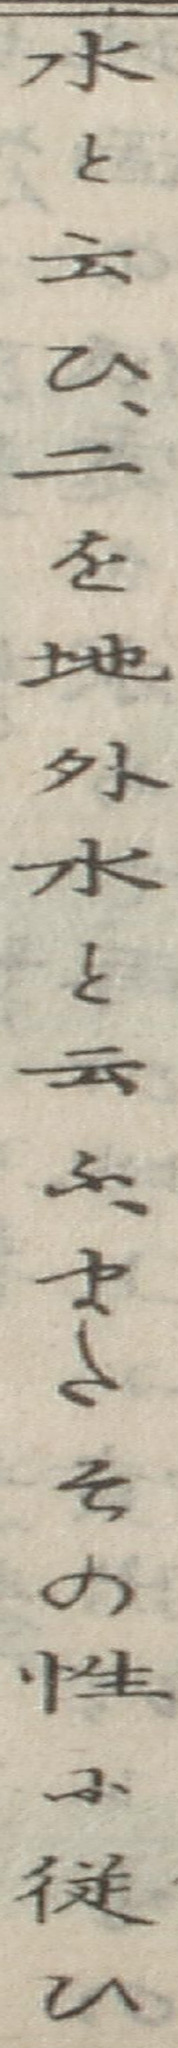水と云ひ、二を地外水と云ふ、またその性に従ひ
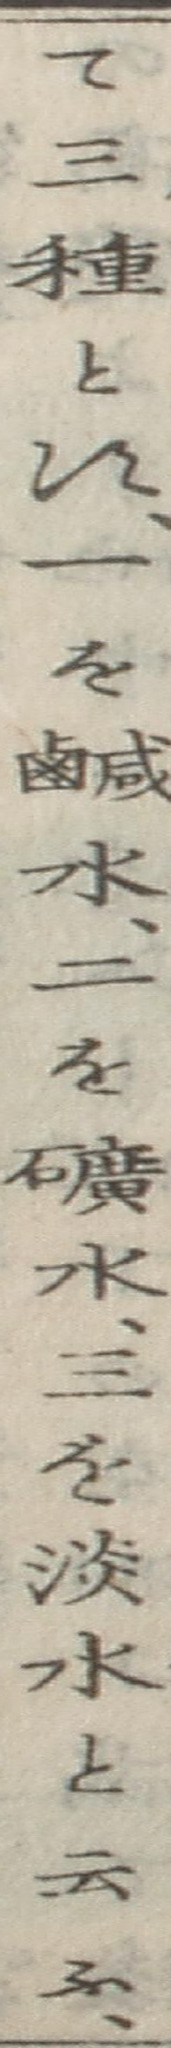て三種とす、一を鹹水、二を鉱水、三を淡水と云ふ、
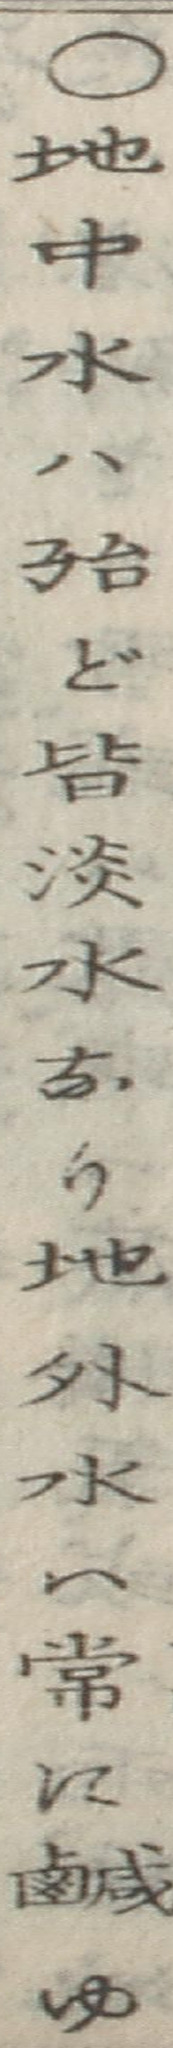〇地中水は殆ど皆淡水なり地外水は常に鹹ゆ
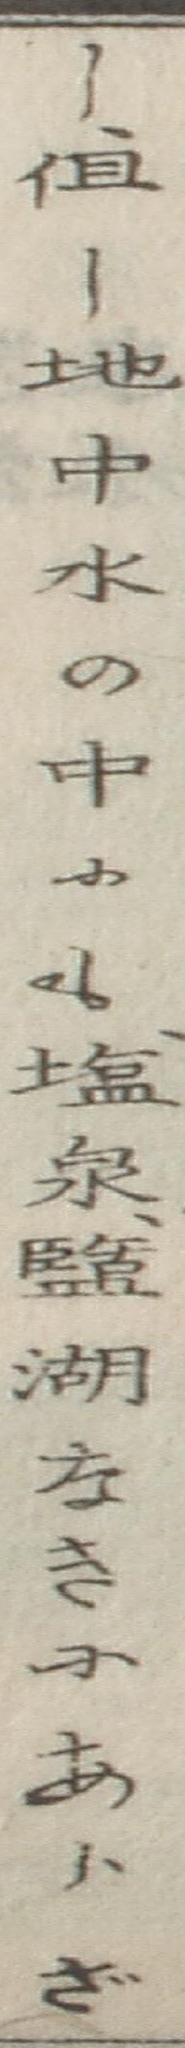し、但し地中水の中にも、塩泉、塩湖なきにあらざ
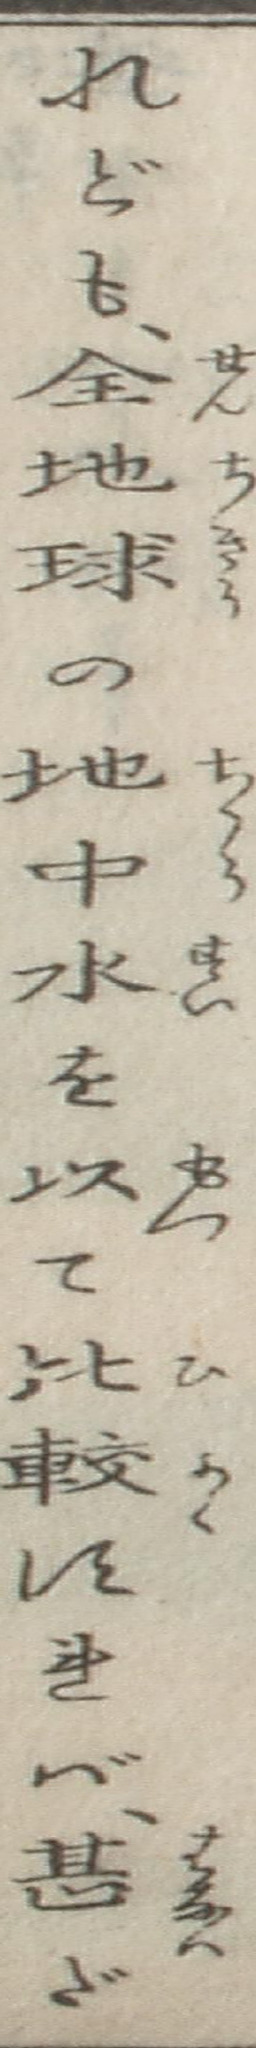れども、全地球の地中水を以て比較すれば、甚だ

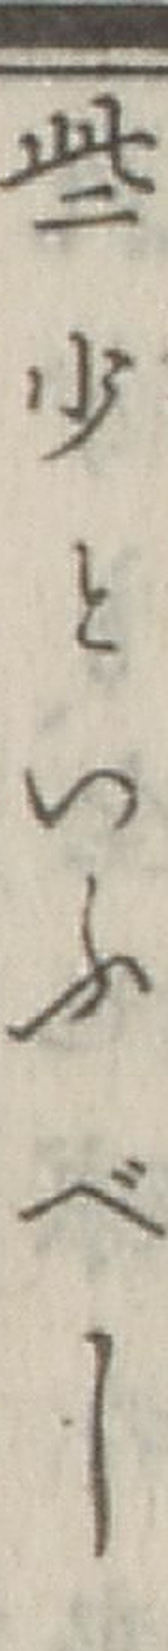些少といふべし
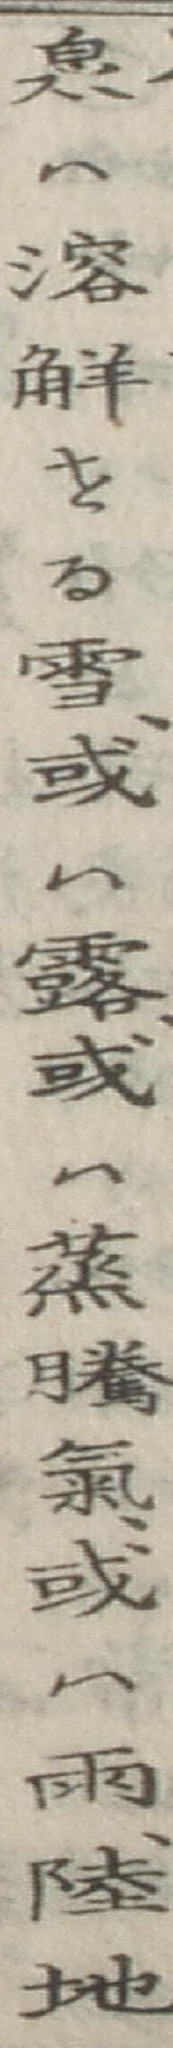泉は溶觧せる雪、或は露、或は蒸騰気、或は雨、陸地
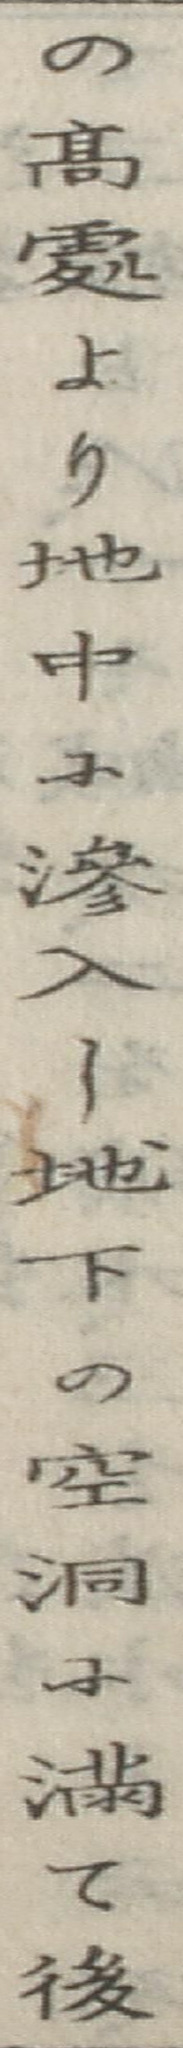の高所より地中に滲入し、地下の空洞に満て後
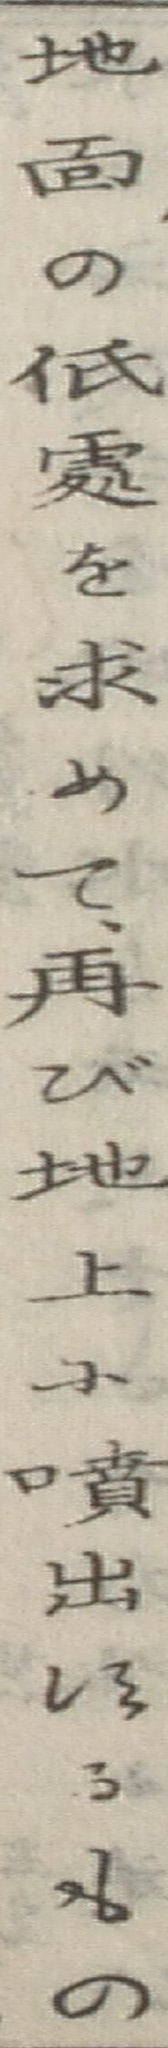地面の低所を求めて、再び地上に噴出するもの
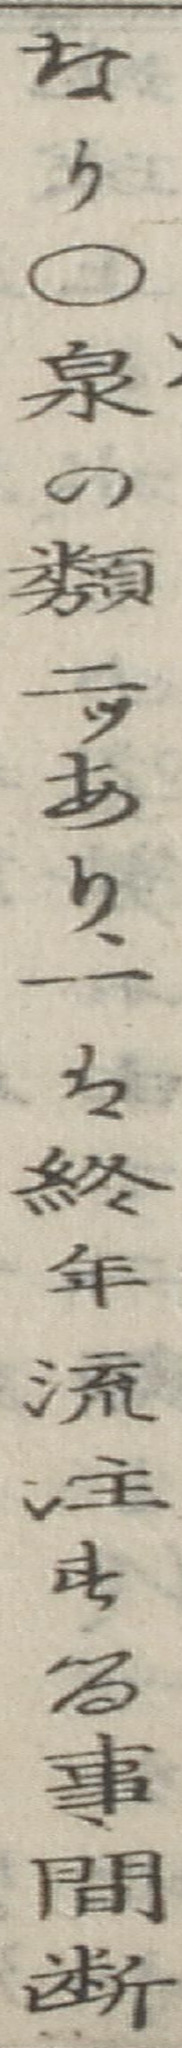なり〇泉の類二つあり、一は終年流注する事間断
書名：訓蒙　天然地理學　中
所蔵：東京大学地震研究所図書室 Earthquake Research Institute Library, The University of Tokyo, JAPAN
